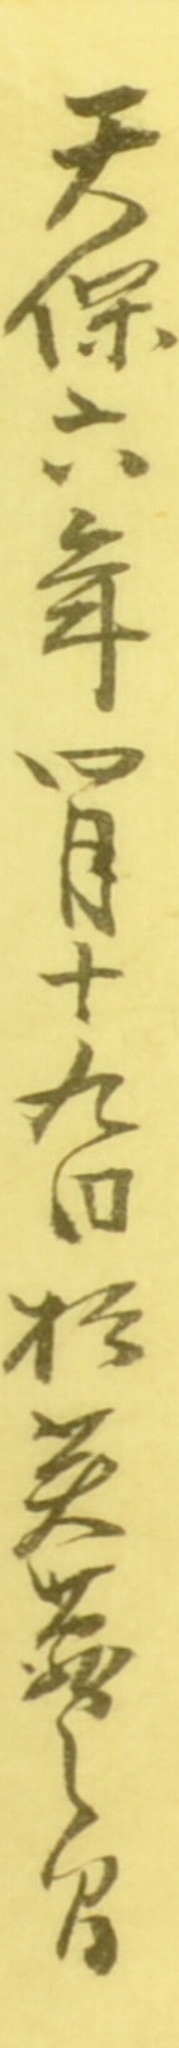天保六年四月十九日於芙蓉之間
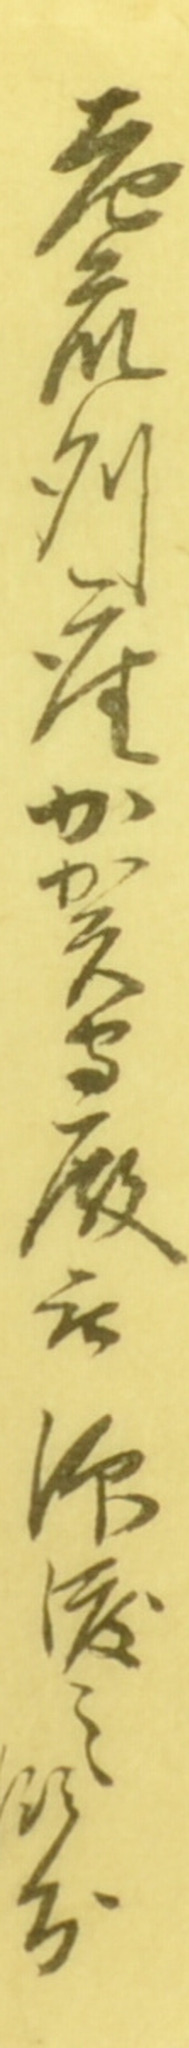老衆列座加賀守殿被仰渡之領分
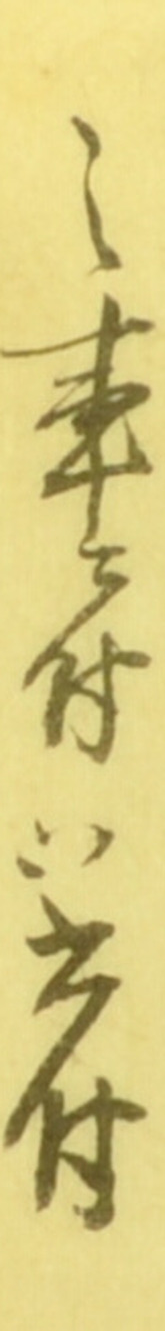之事ニ付御書付

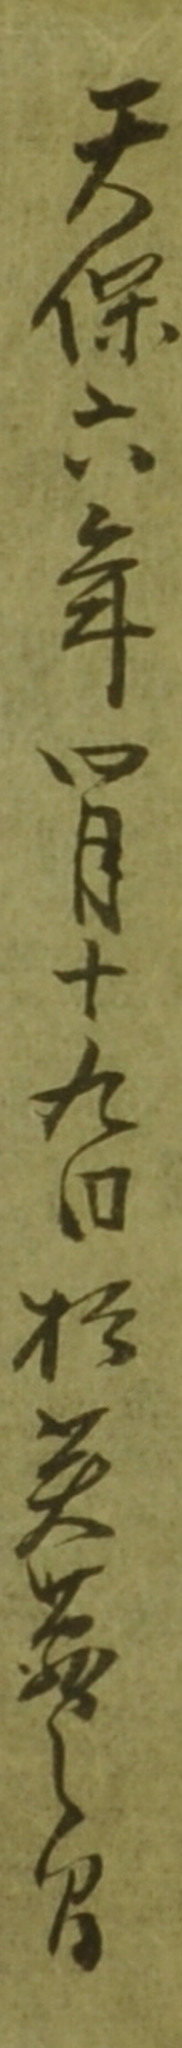天保六年四月十九日於芙蓉之間
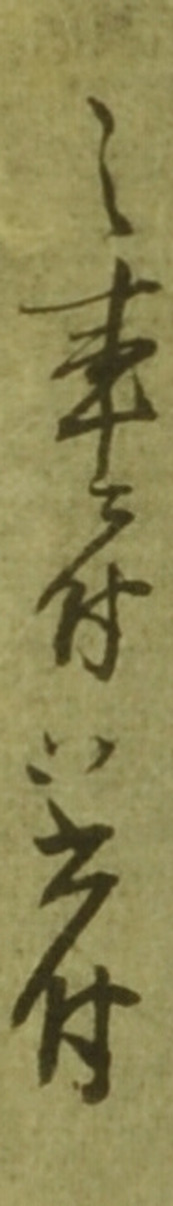之事ニ付御書付
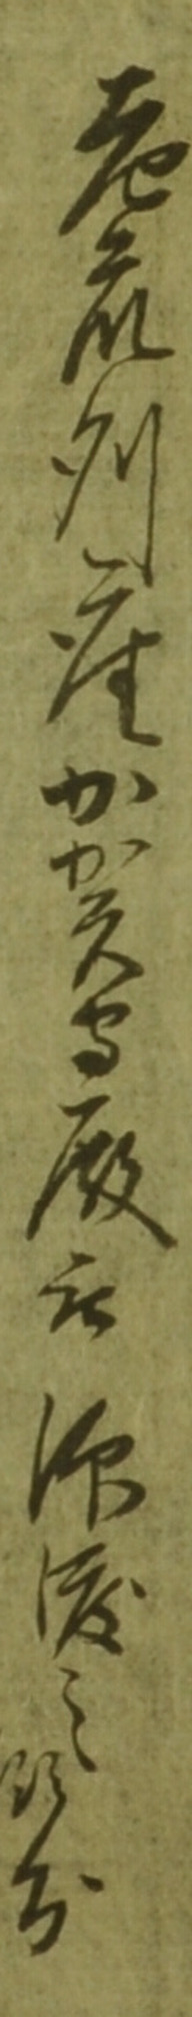老衆列座加賀守殿被仰渡之領分

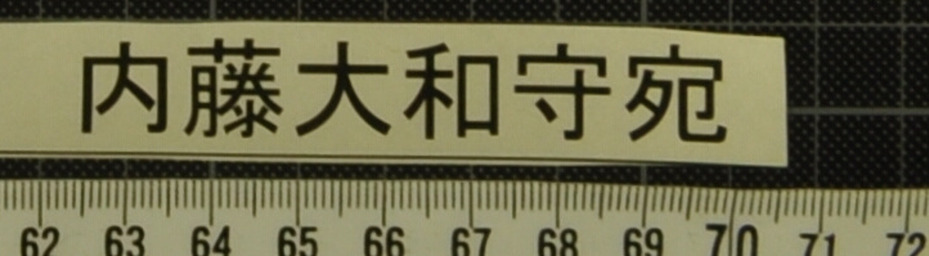内藤大和守
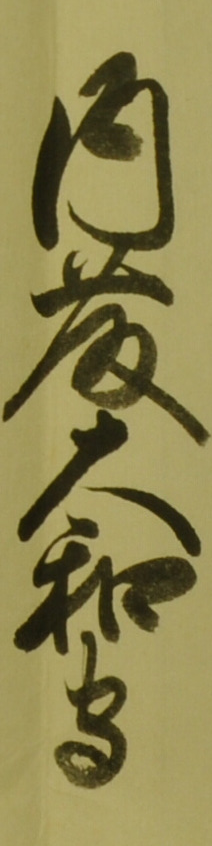内藤大和守
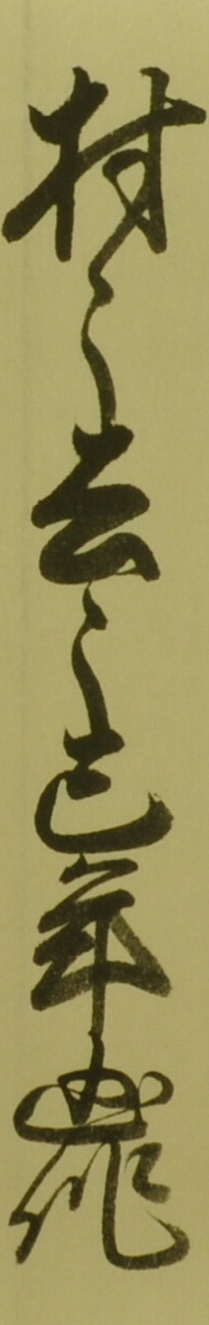村々去々巳年凶作
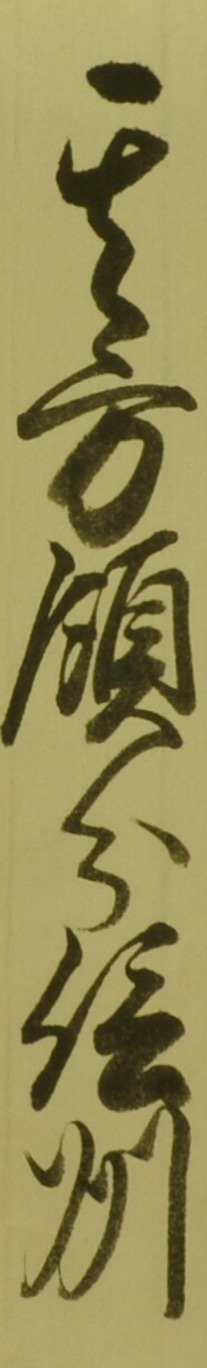其方領分信州
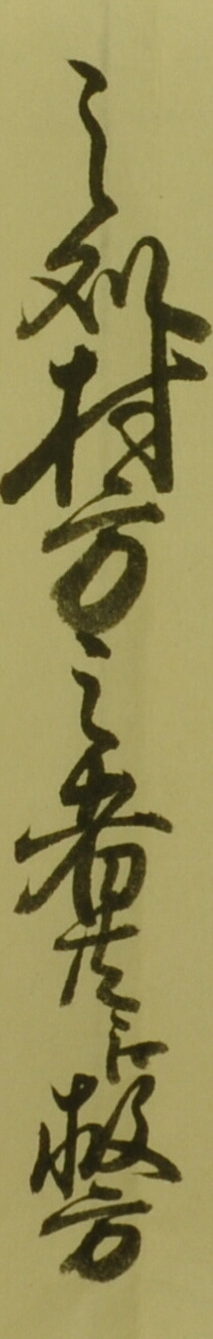之処村方之者共え救方
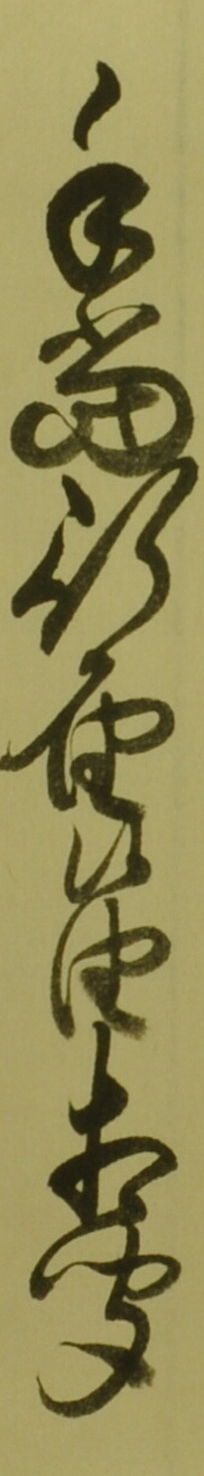手当行届候由相聞
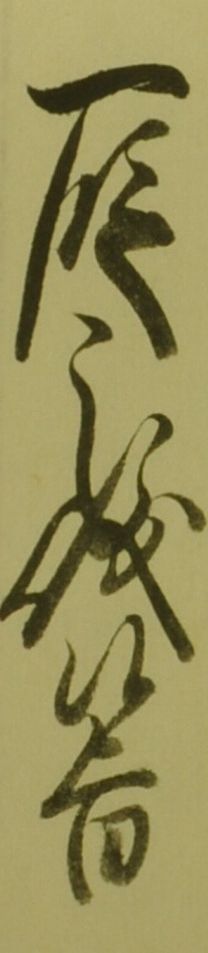一段之儀候旨
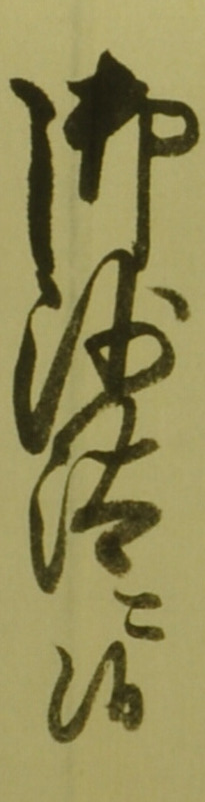御沙汰ニ候

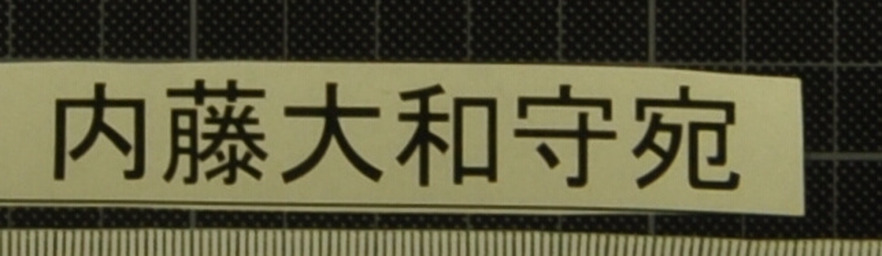内藤大和守え
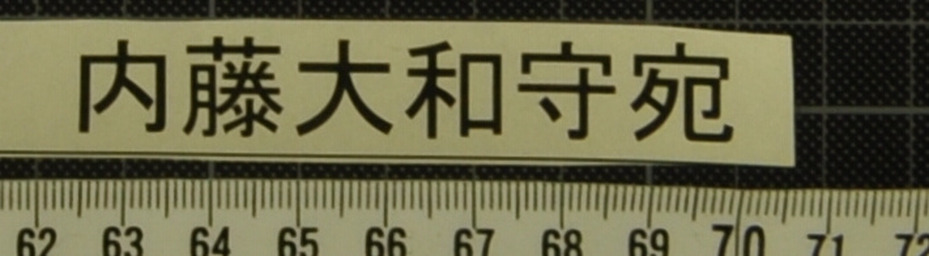内藤大和守え
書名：御書付
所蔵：伊那市立高遠町図書館・合同会社AMANE
